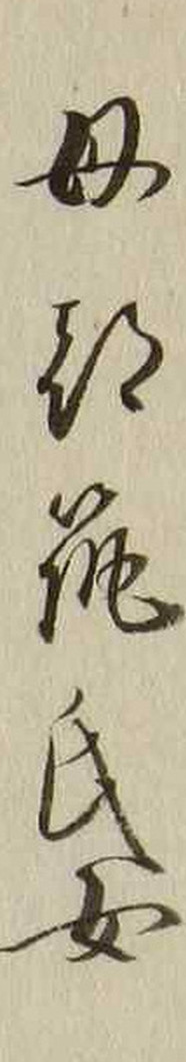母都筑氏女
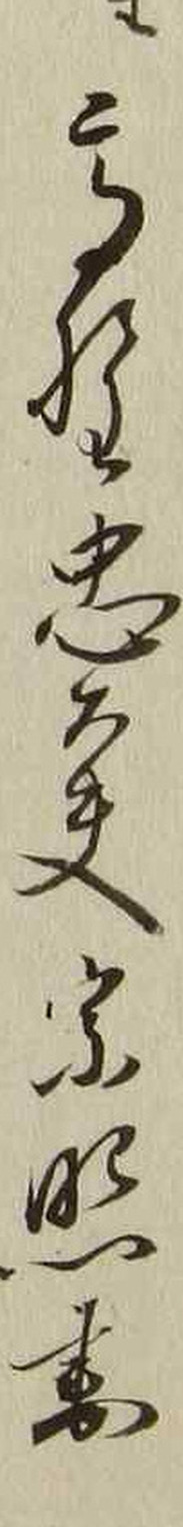高野忠太夫宗照妻
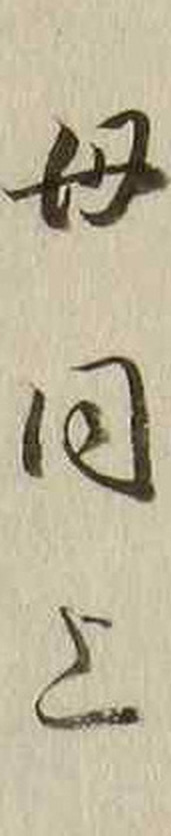母同上
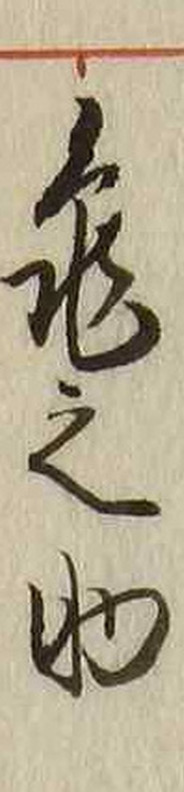亀之助
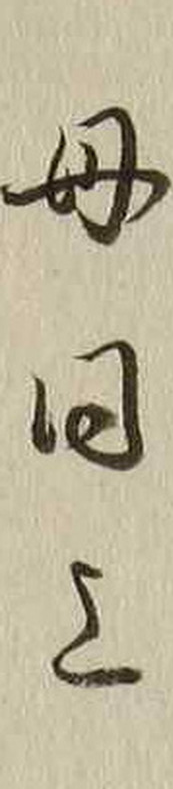母同上
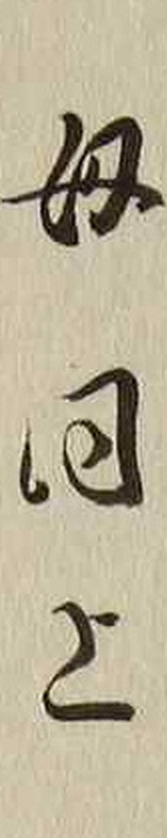母同上
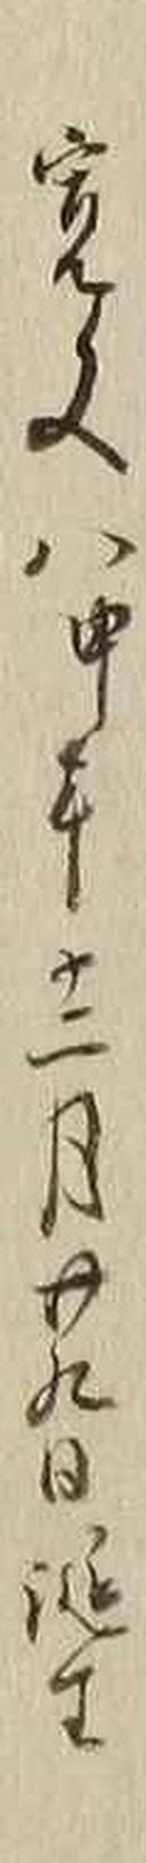寛文八申年十二月廿九日誕生
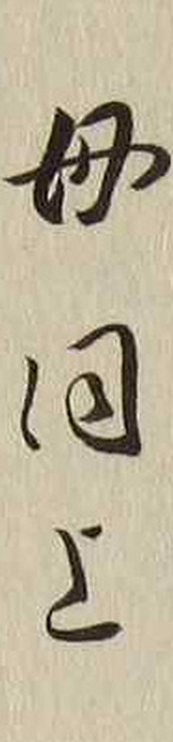母同上
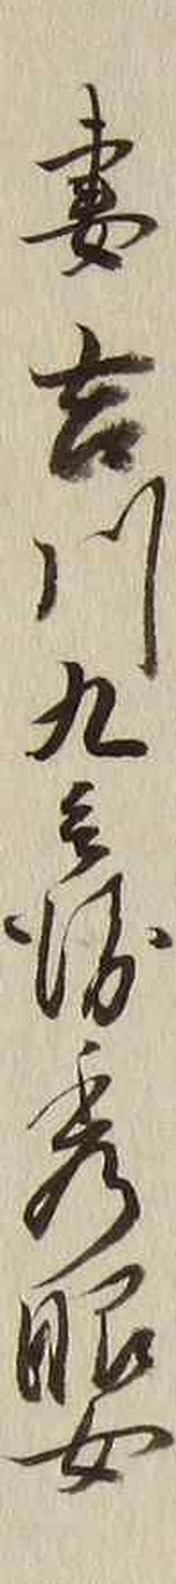妻吉川九兵衛秀昭女
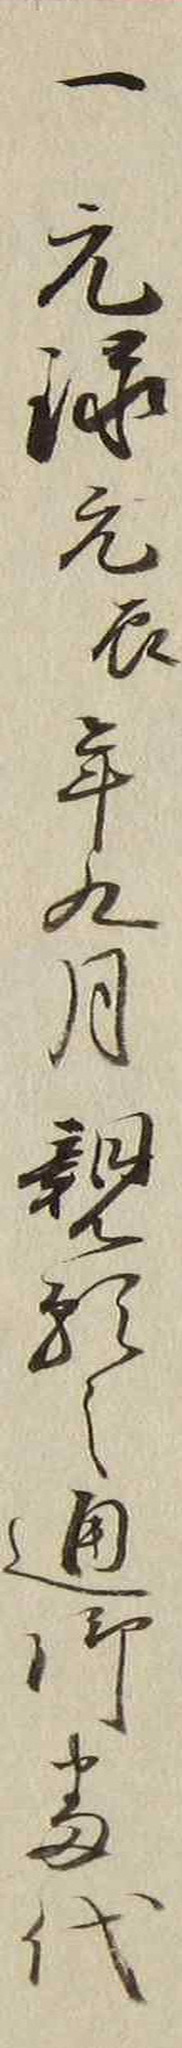一元録元辰年九月親願之通御番代
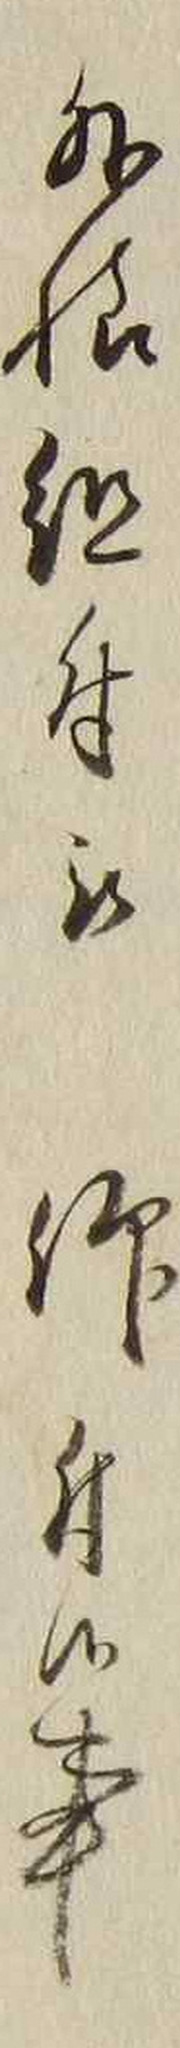外様組付被仰付候事
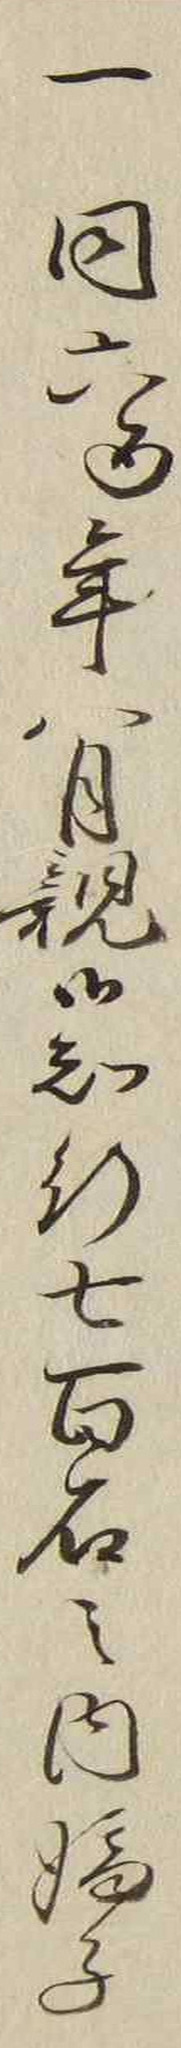一同六酉年八月親御知行七百石之内嫡子

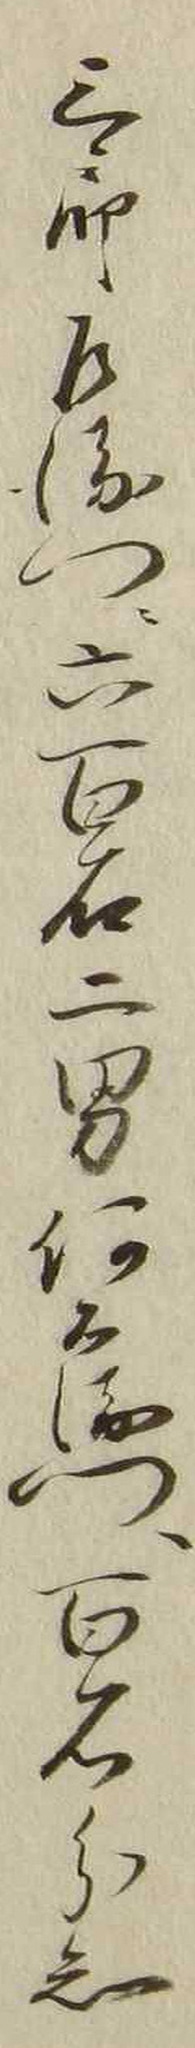三郎左衛門ニ六百石二男何右衛門へ百石分知
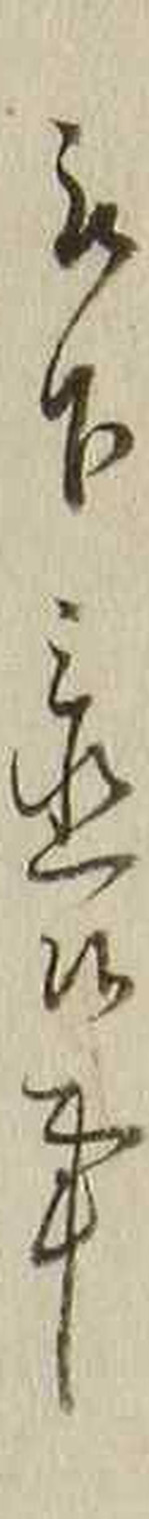被下置候事
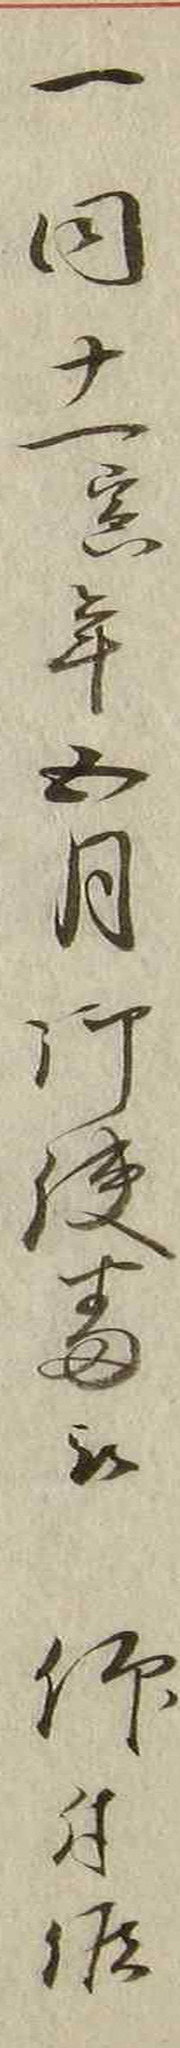一同十一寅年五月御使番被仰付候
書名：諸士系譜　巻之25　い之部25
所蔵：会津若松市立会津図書館
